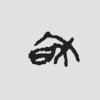秋
